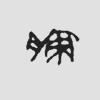{月朿}
